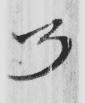乃
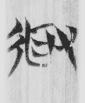{彳取}
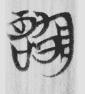詢
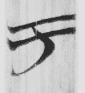于
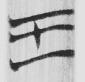王
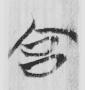宮
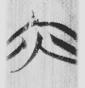亦
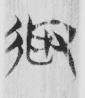{彳取}
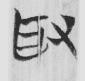取
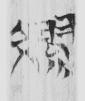{歹翏}
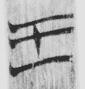王
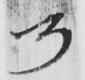乃
